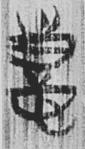𢝫（喜）
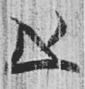之
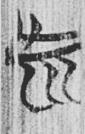巟
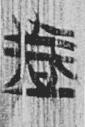者
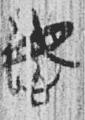○（悔）
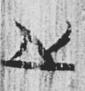之
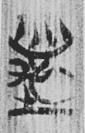{萬土}（萬）
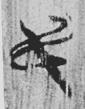民
